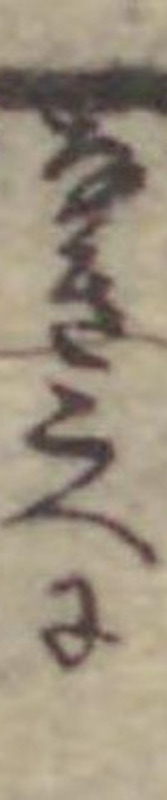なきこえに
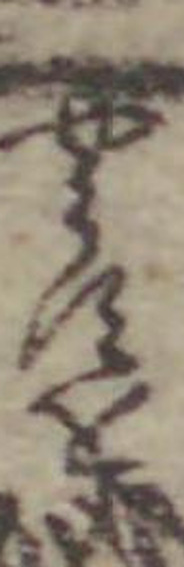やうすを
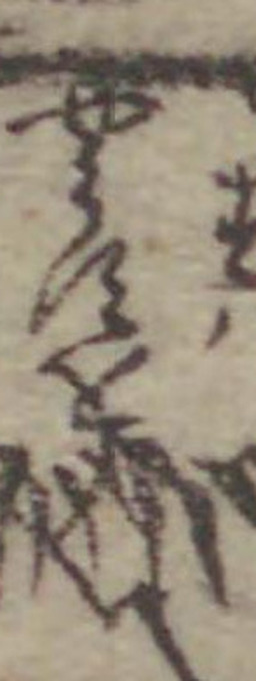やうすを
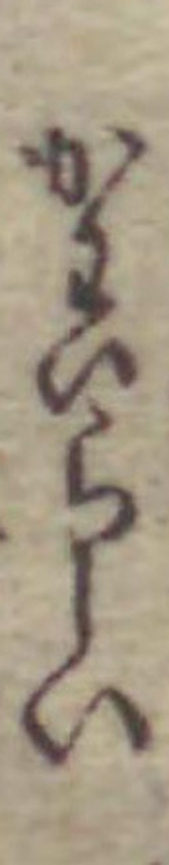かわいらしい
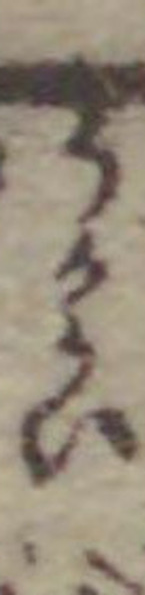うかゝい
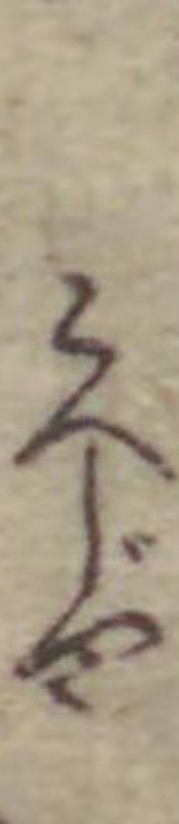こへじや
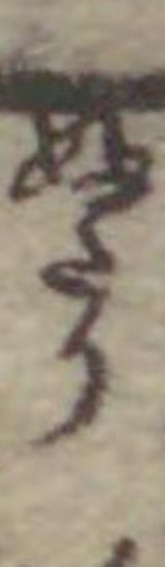ふたり
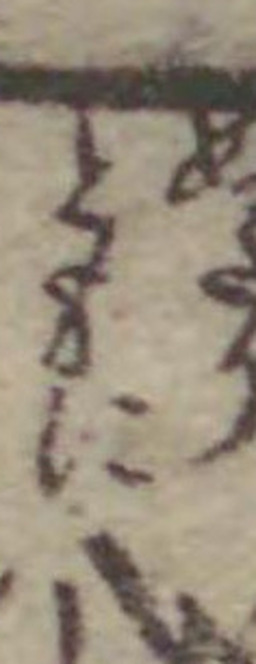ともに
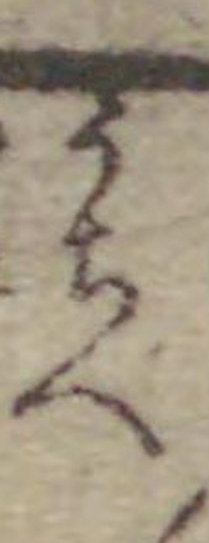うちへ
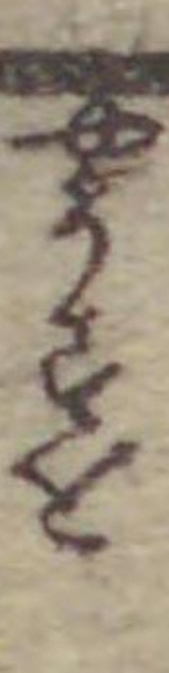やうすを
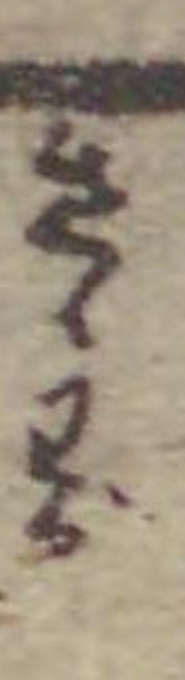きゝわが
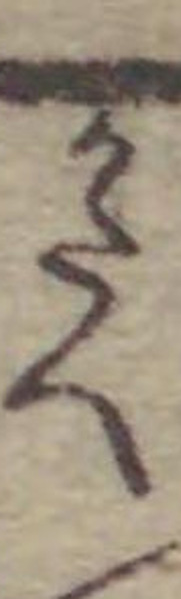かたへ
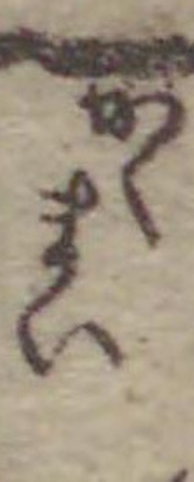かくまい

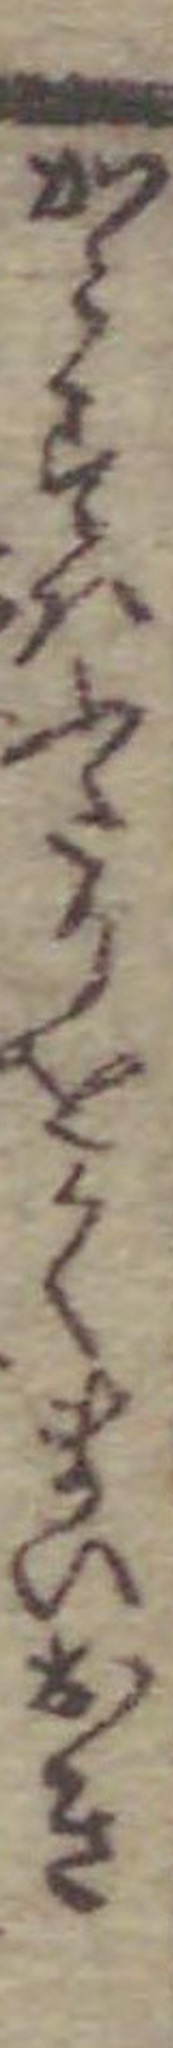からすはふたりをかくまいおき
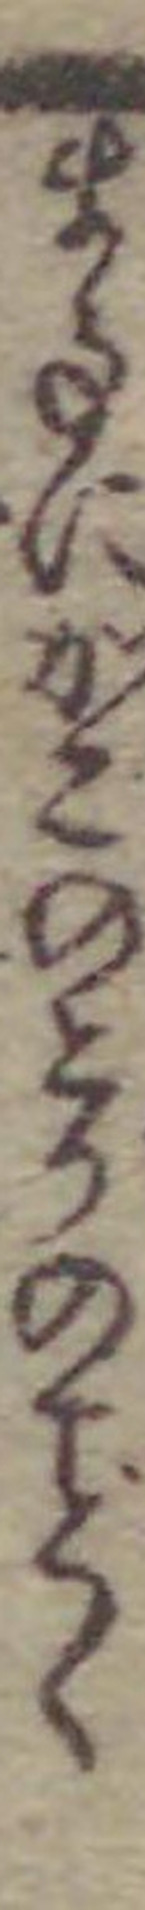ま事にかごのとりのごとく
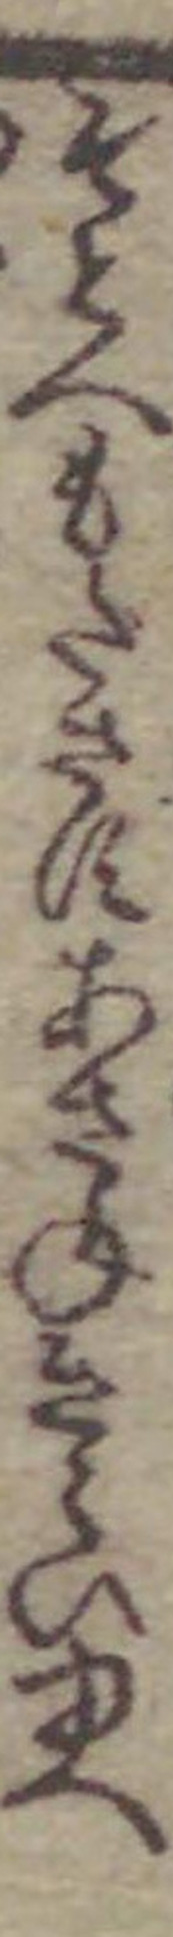そとへもたさすあさねきらいゆへ
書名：烏行水諺草 3巻
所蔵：国立国会図書館 National Diet Library, JAPAN
